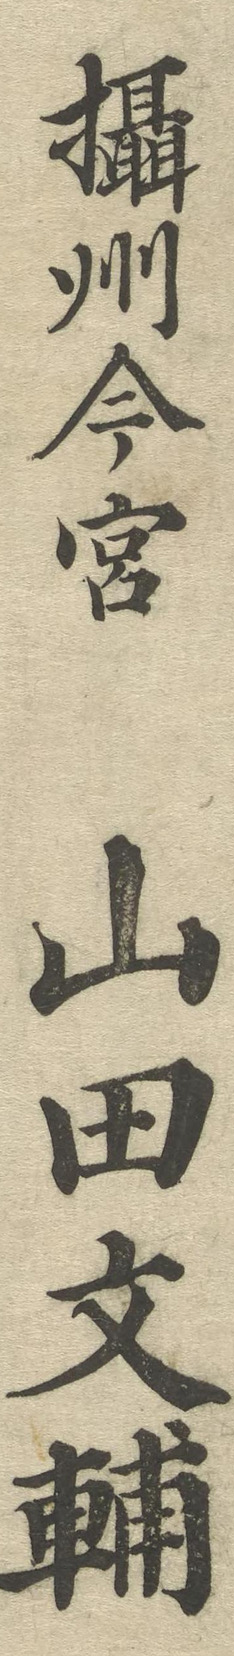摂州今宮山田文輔
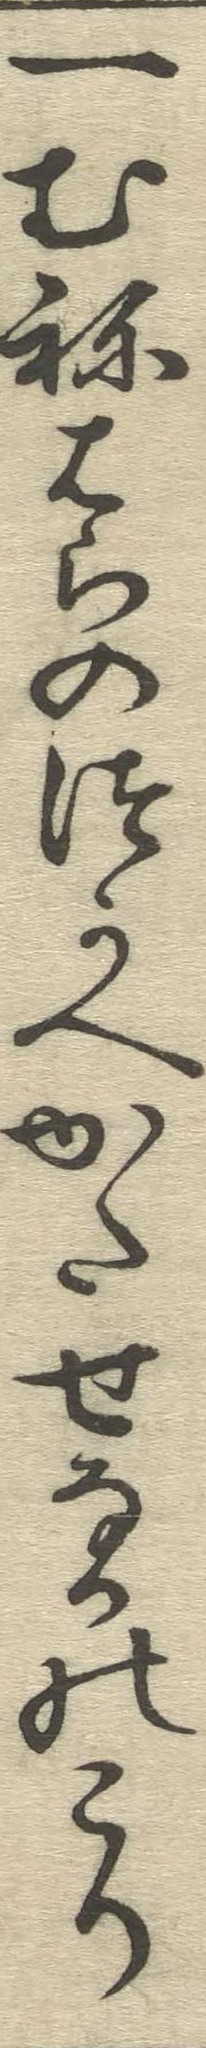一むねはらのつかへかたせなかのこり
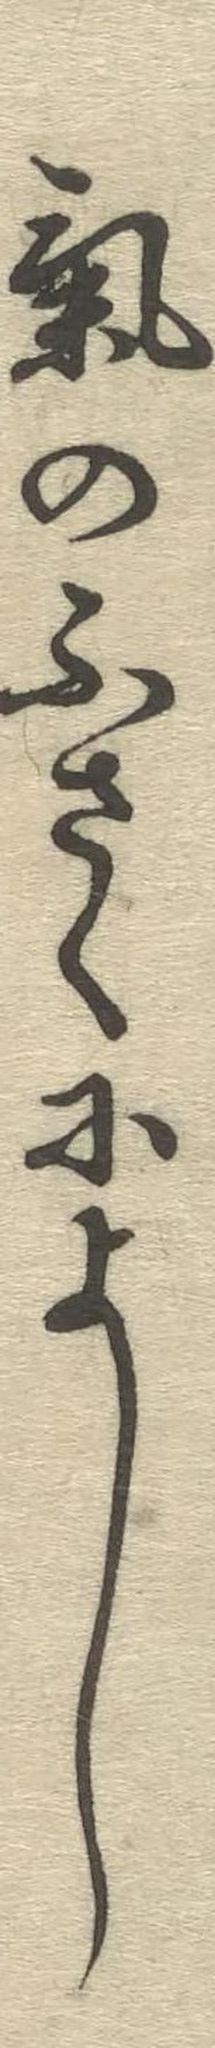気のふさくによし
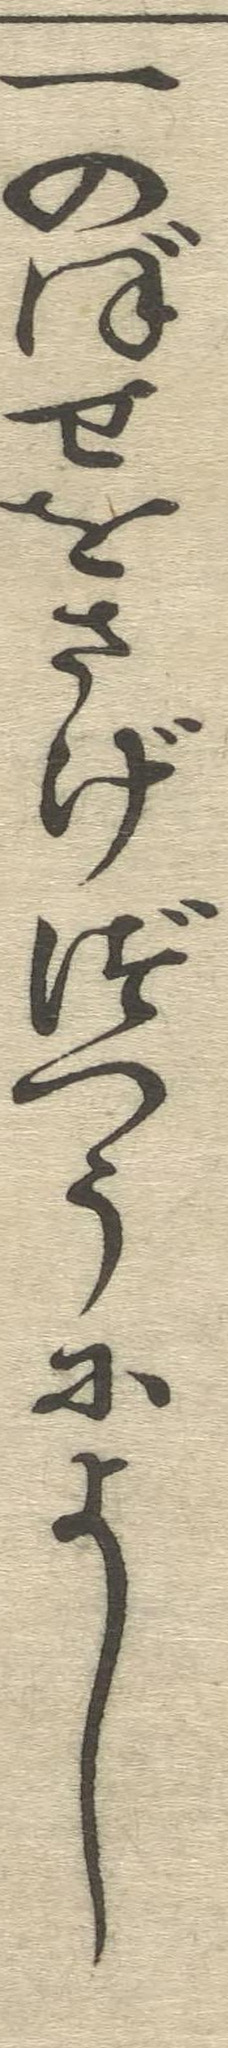一のぼせをさげづつうによし
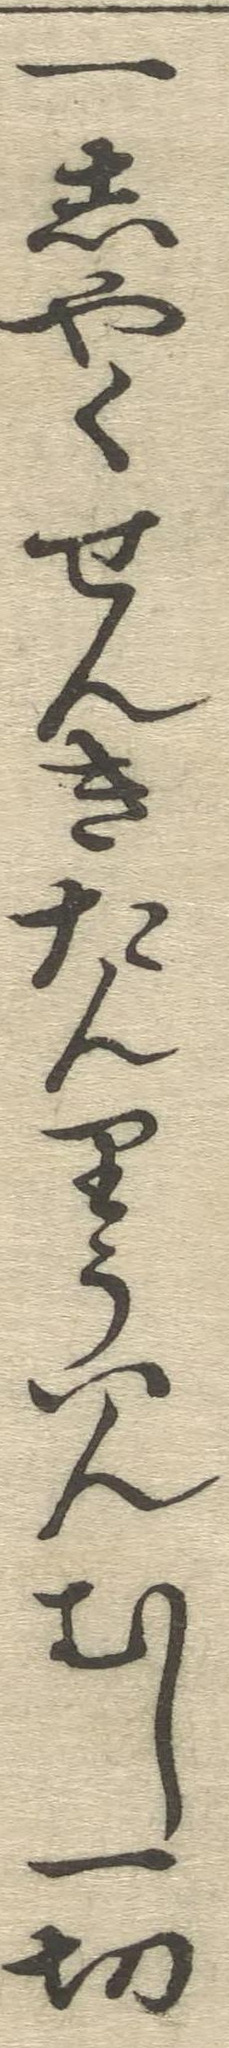一しやくせんきたんりういんむし一切
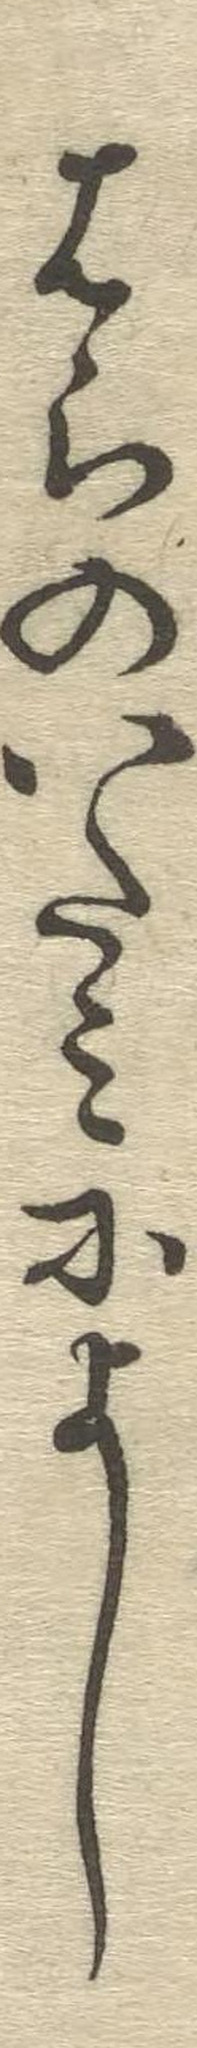はらのいたみによし
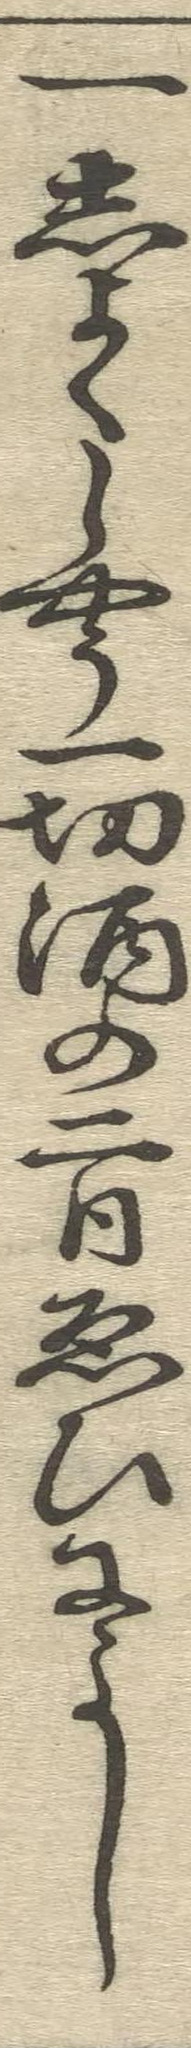一しよくしやう一切酒の二日ゑひによし
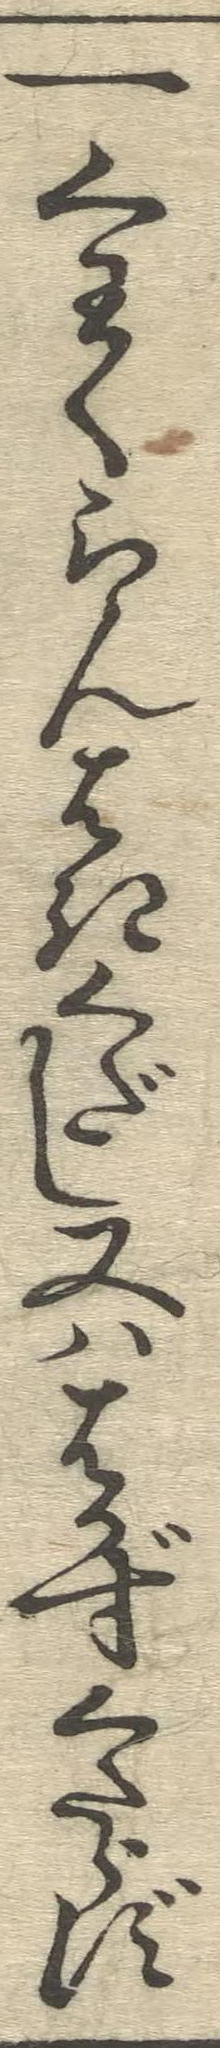一くわくらんはきくだし又ははかずくだらず
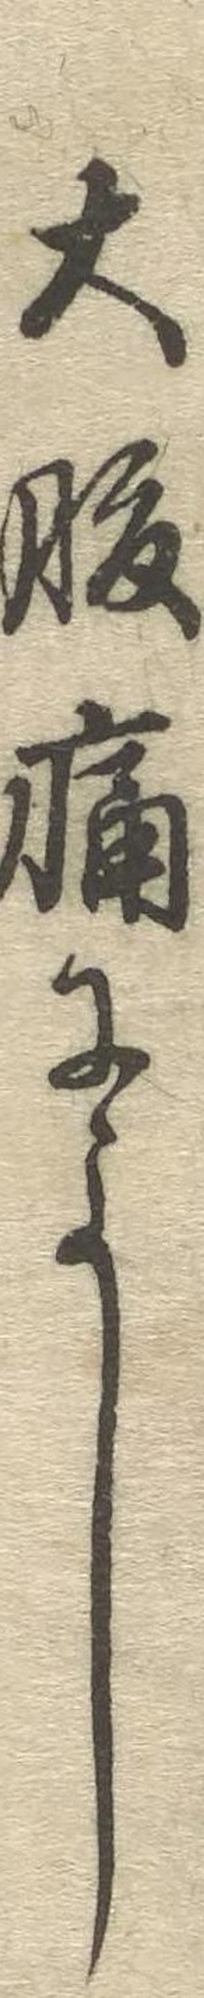大腹痛によし
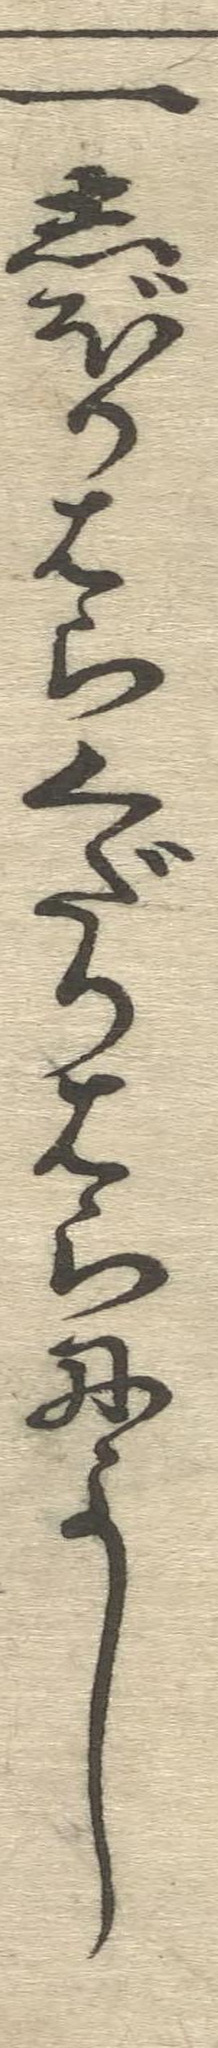一しぼりはらくだりはらによし
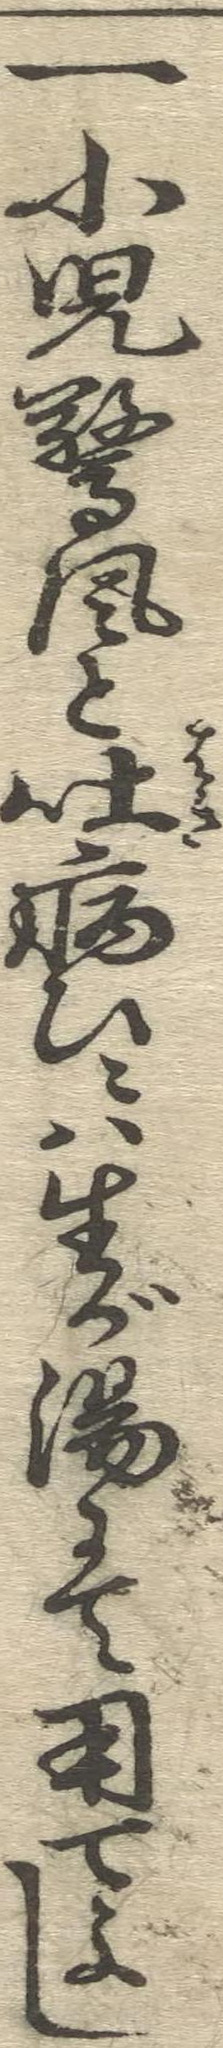一小児驚風と吐病ひには生が湯にて用てよし
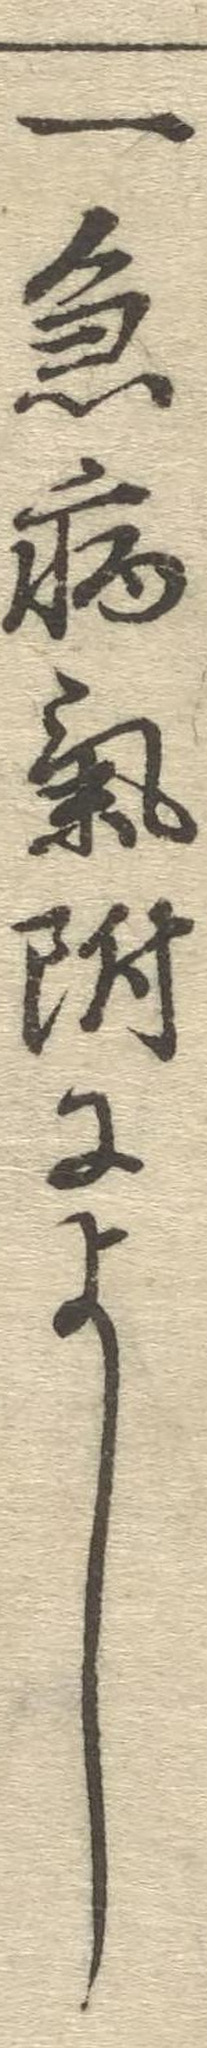一急病気附によし
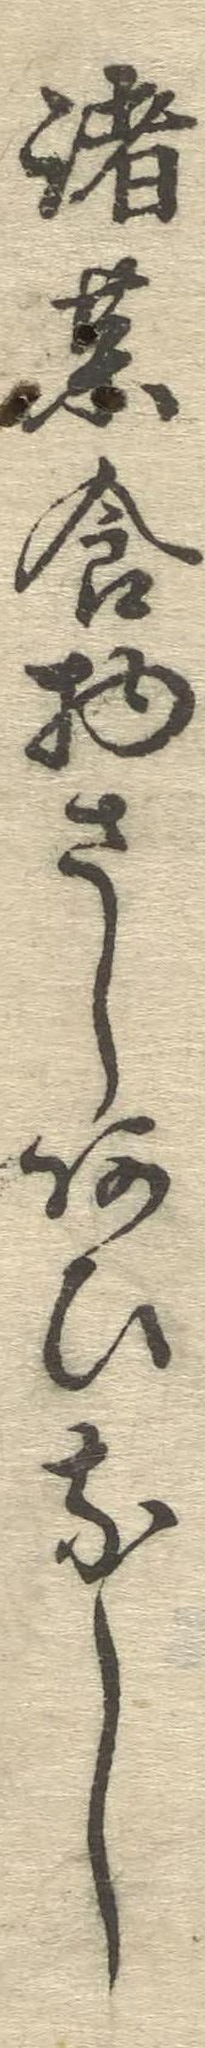諸薬食物さしあひなし
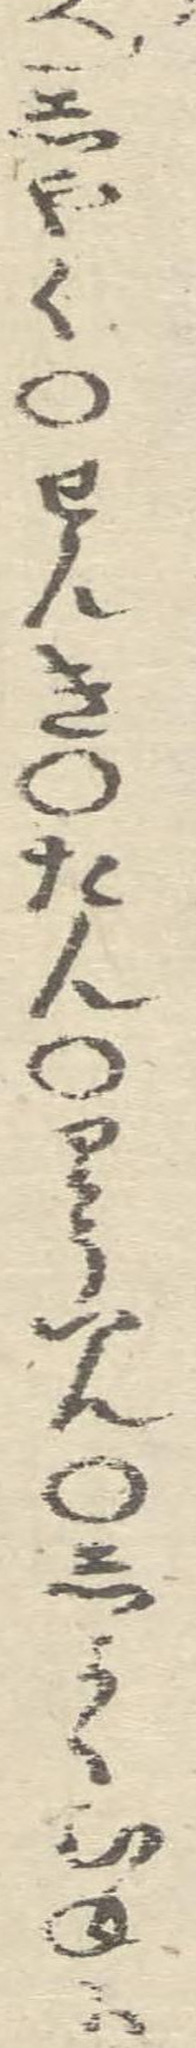しやく○せんき○たん○りういん○しよくむねに
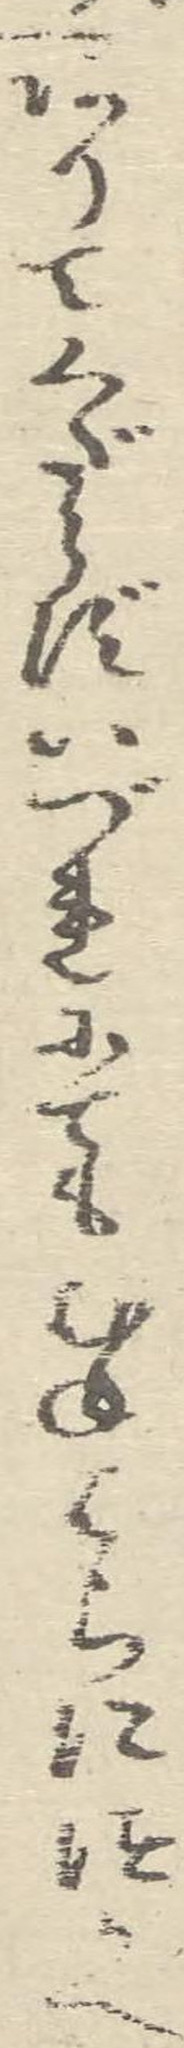ありてくだらずいずれにてもむねはらにつかへ
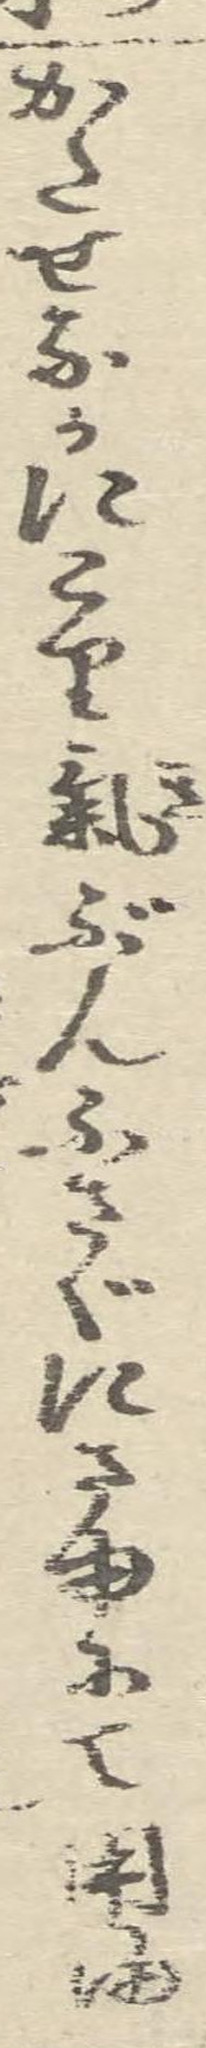かたせなかにこり気分ふさぐにさゆにて用ゆ
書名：浪華薬種問屋能書張交帖. 二
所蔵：国立国会図書館 National Diet Library, JAPAN
